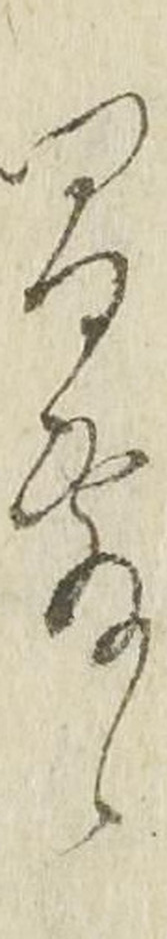間敷候
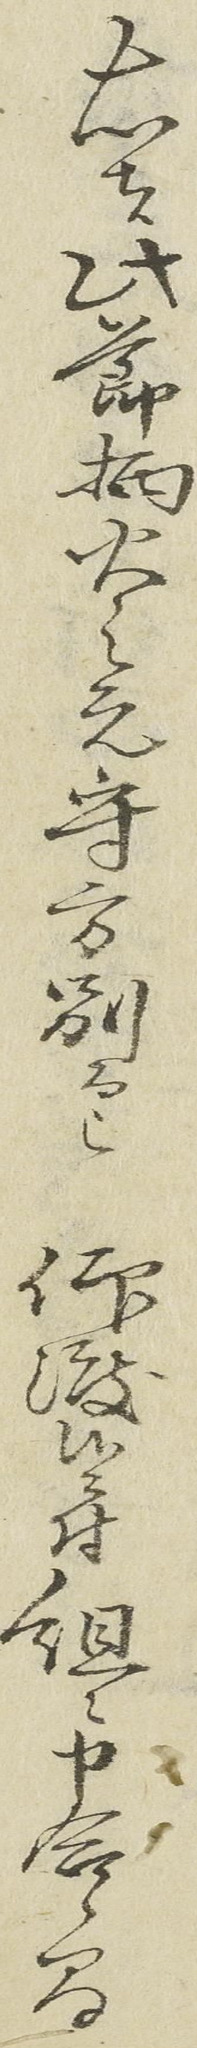右は此節柄火之元守方別而被仰渡候二付組々申合候間

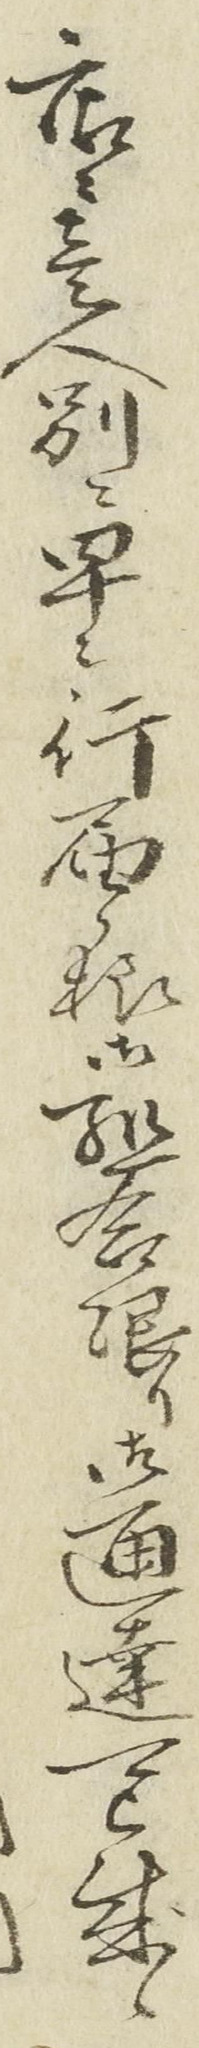店二壱人別二早々行届候様御組合限り御通達可被成候
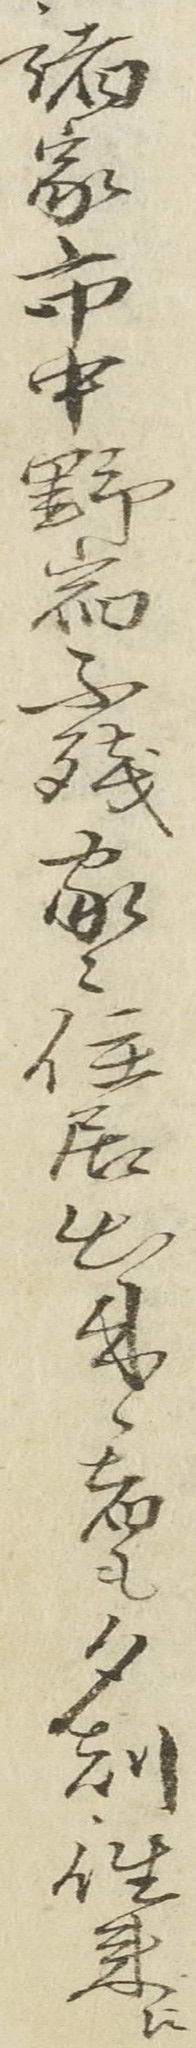諸家市中野宿不残家ニ住居出来候者も夕刻往来え
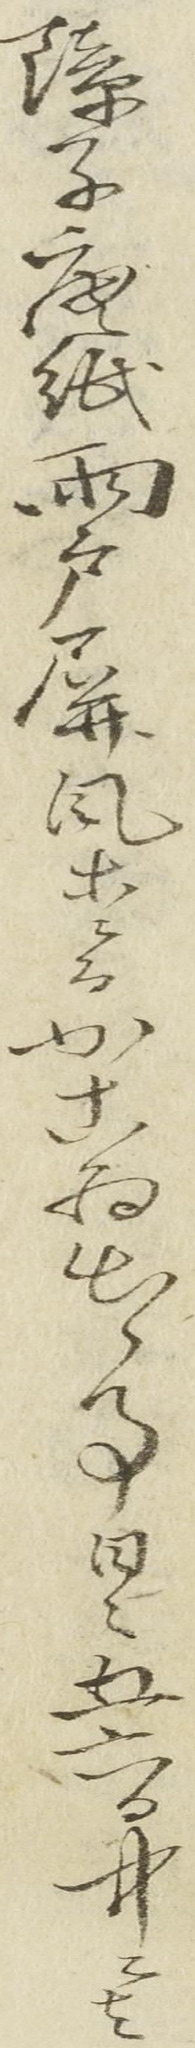障子唐紙雨戸屏風等二而かこい出候事日々五六日中二は
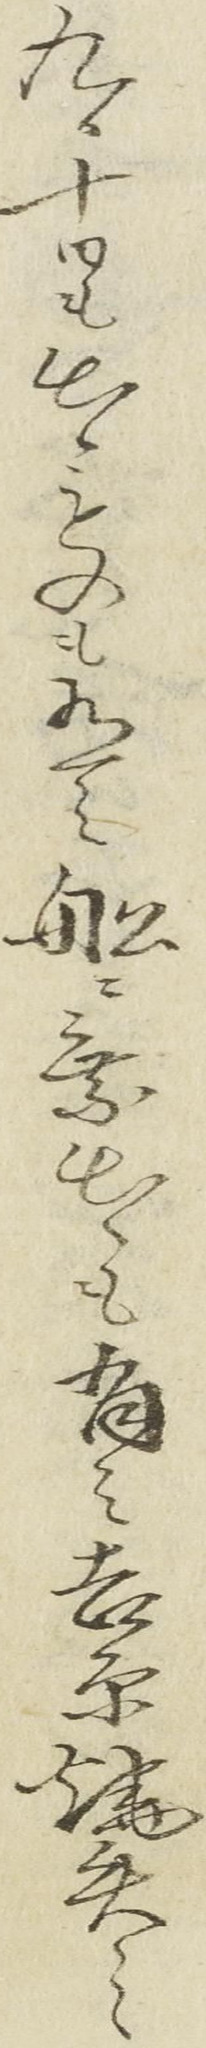九日十日も出候ものも有之船二乗出候も有之吉原焼失之
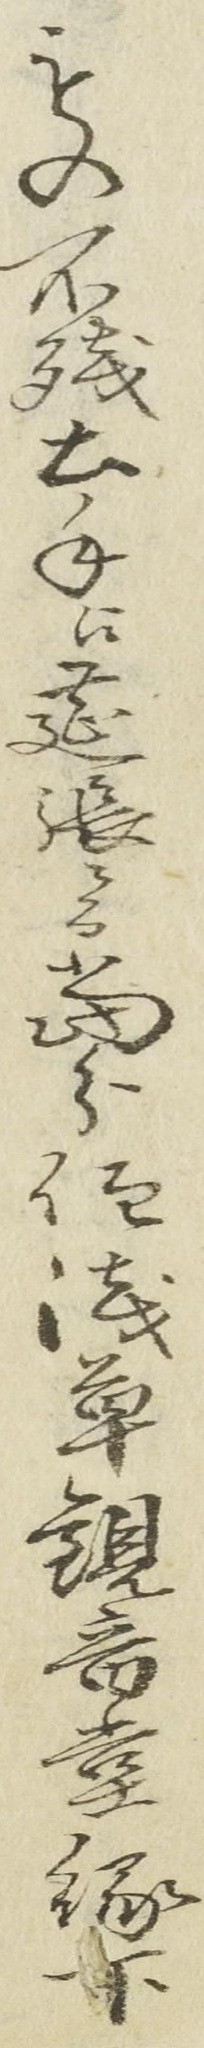もの不残土手え筵張二而当分住浅草観音堂縁下
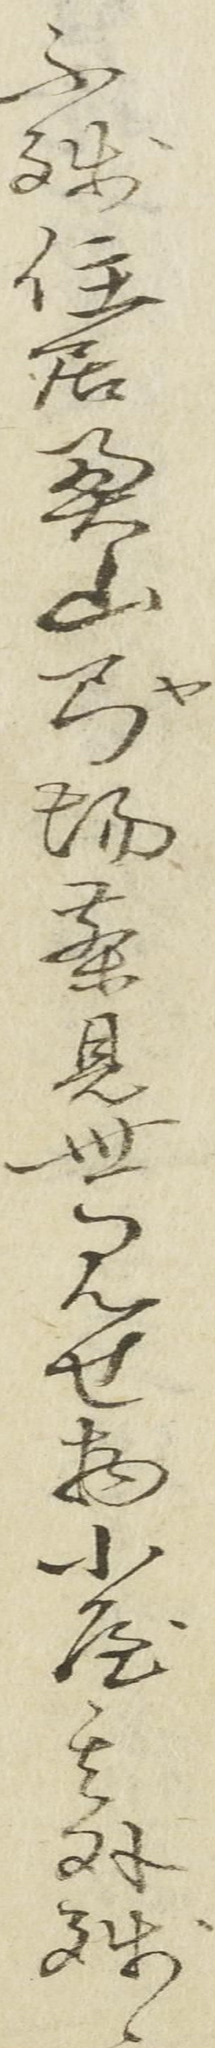不残住居奥山弓場茶見世見せ物小屋其外残候
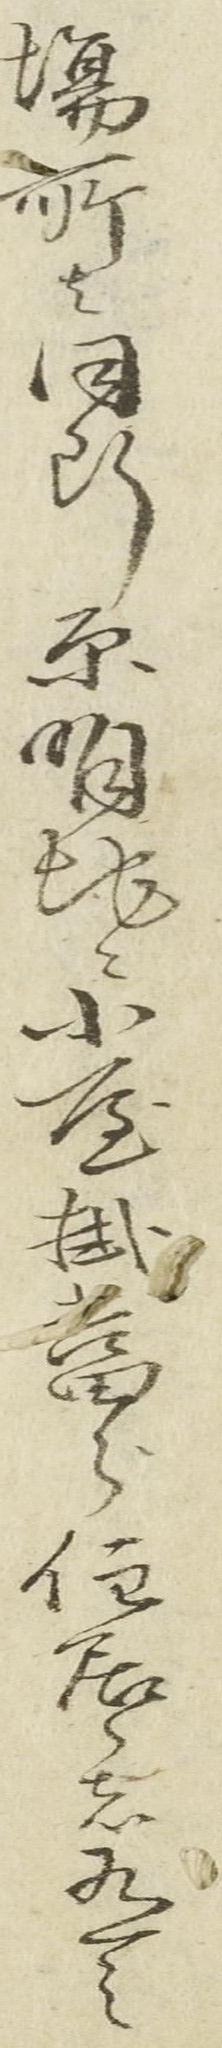場所は同断原明地に小屋掛当分住居候者有之
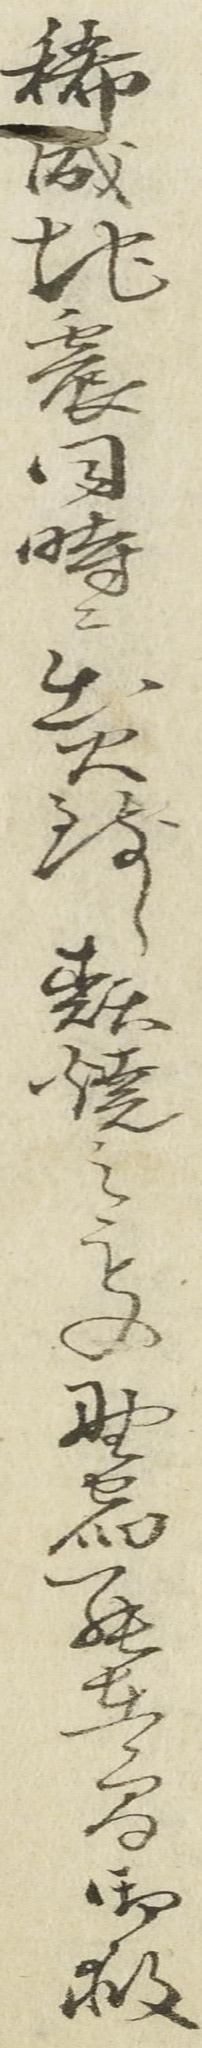稀成地震同時二出火致し類焼之もの野宿罷在候間御救
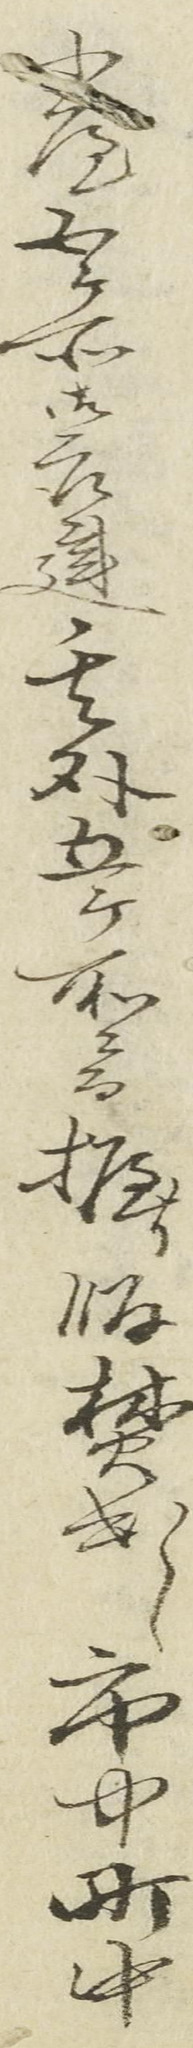小屋五ヶ所御取建其外五ヶ所二而握り飯焚出し市中町中
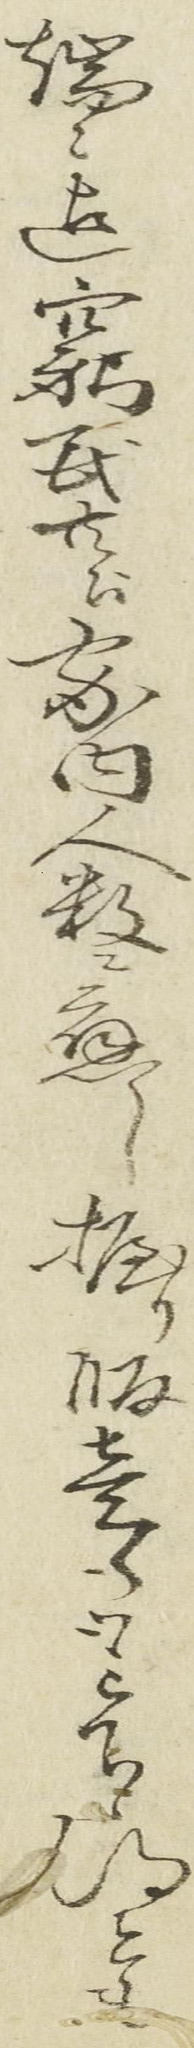端々迄窮民共え家内人数二応じ握り飯壱ツヅゝ被下候得とも
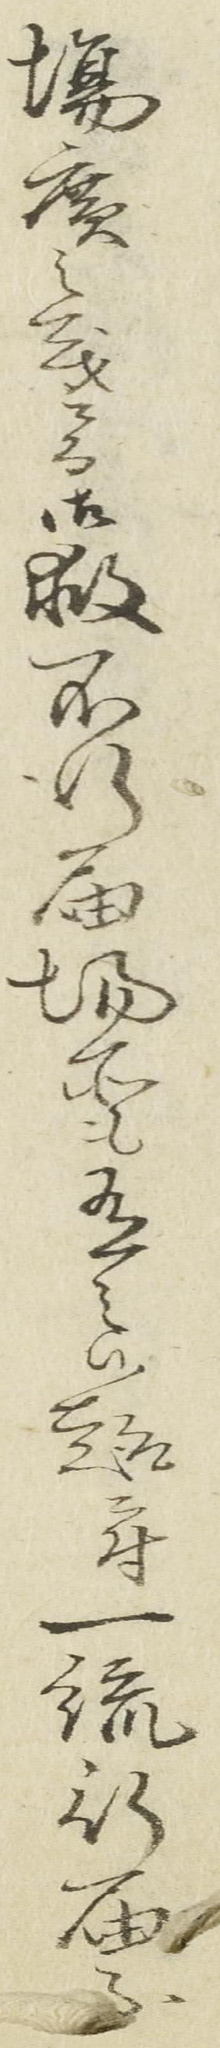場廣之義に而御救不行届場所も有之候趣弐付一統行届不
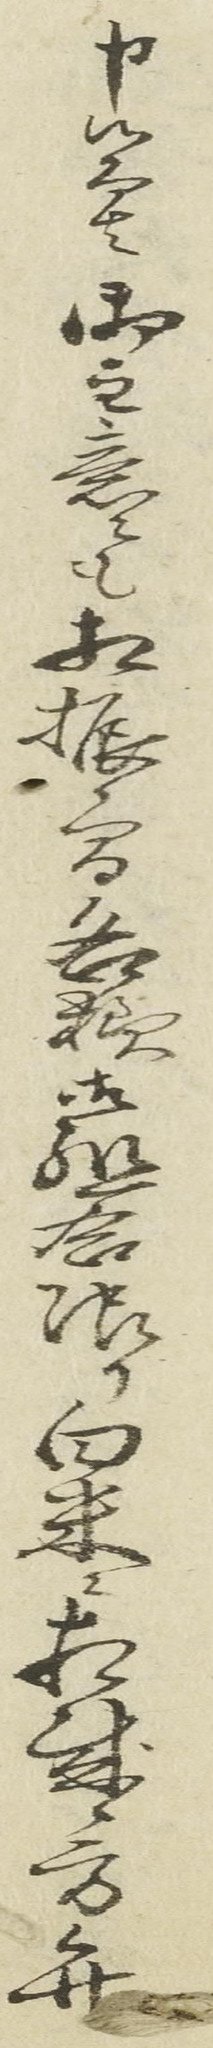申候而は御主意二も相振候間各様御組合限り白米に相来候方弁
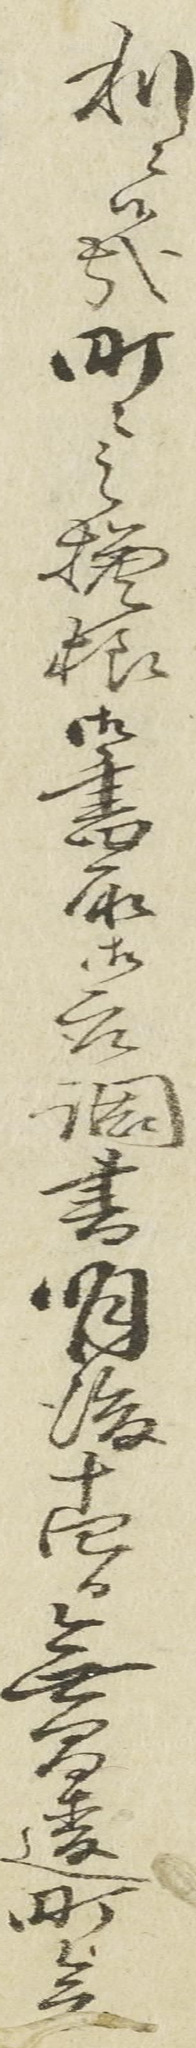利二候哉町々之模様御書取御取調書明後十四日無間違町会
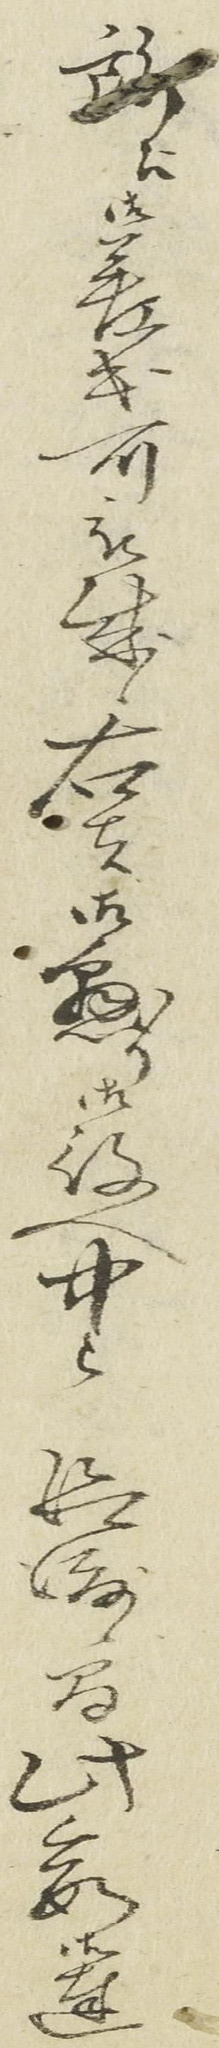所え御差出可被成候右は御懸り御役人中被仰渡候間此段御達
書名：安政二乙卯年十月二日大地震之事
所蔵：東京大学地震研究所図書室 Earthquake Research Institute Library, The University of Tokyo, JAPAN
